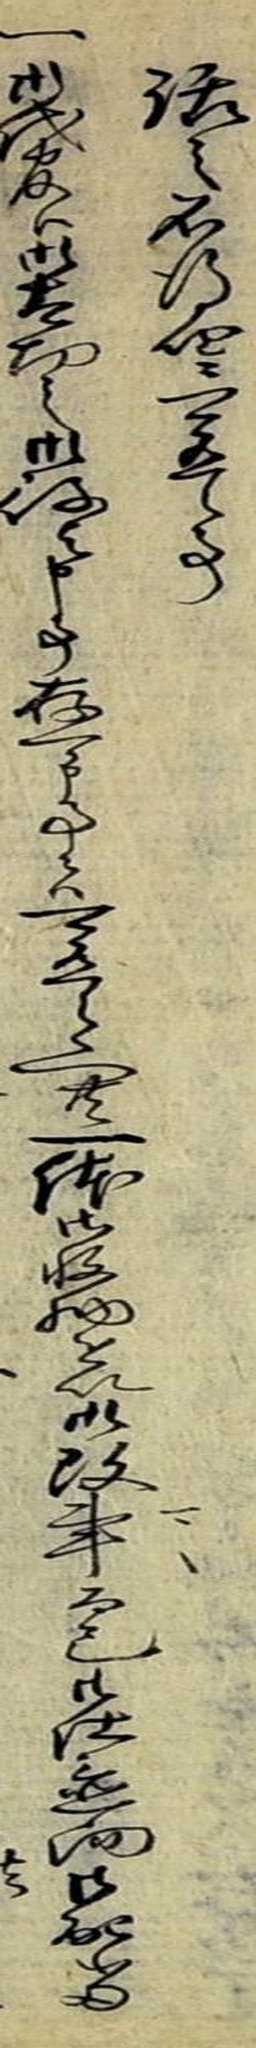一御代官ハ御太切之御役与申事存可申事ニハ可有之候へ共一体御収納を以御改事而已御仕置向御配当
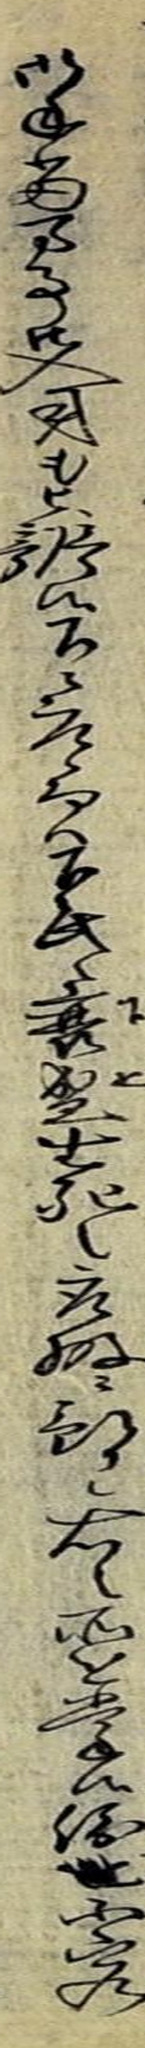御手当万事御入用も被弁候下ニ取候而ハ下民之衰盛生死之取扱ニ預り候右之所を掌候儀者不容
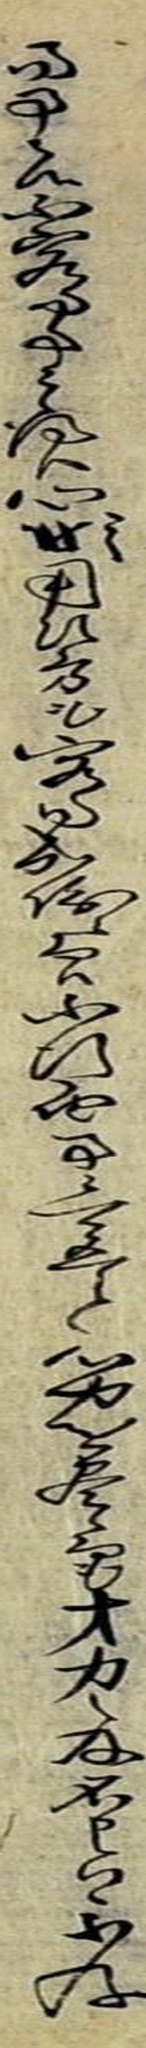易事ニ候不容易ニ候得ハ心之用ひ方も容易成儀ニ而ハ不行届事ニ可有之と心力を尽候而も才力之及不申候ハヽ不及
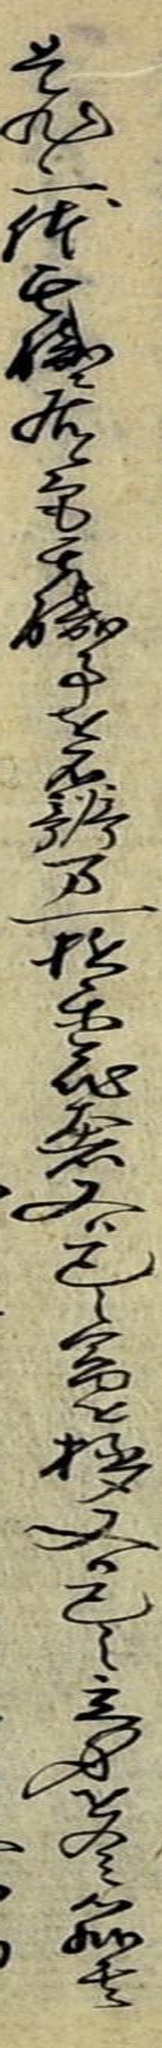是非候一体其職ニ居候而も其職事を不弁万一遊楽花奢又ハ己之富を極メ又ハ己之立身をのみ心掛其
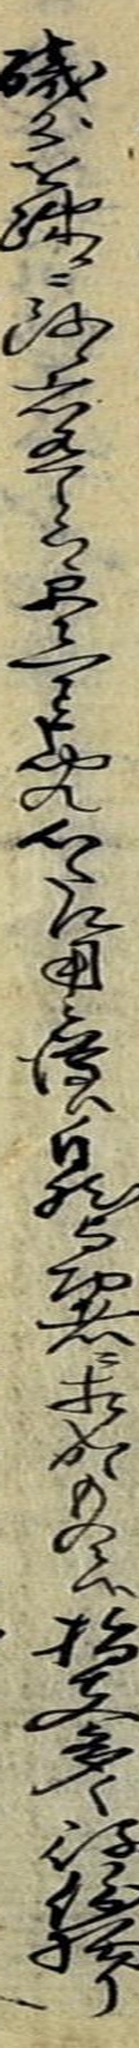職分を疎かニ致候者有之候ハヽ早々可被申聞候心たに用候得ハ自然与功者ニ相成候ものニ候指支多く役儀拘り
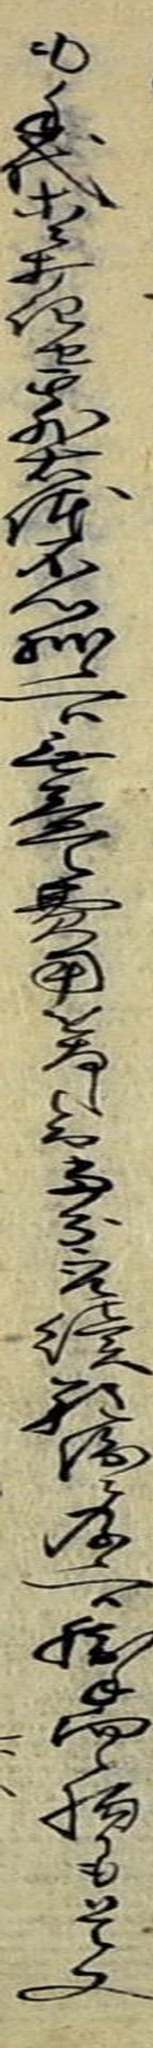も手代等ニ打任セ其外右体不心掛候ヘハ無益之費用をなし候而当分取続難儀ニ及候ヘハ勝手向之拘りも是又
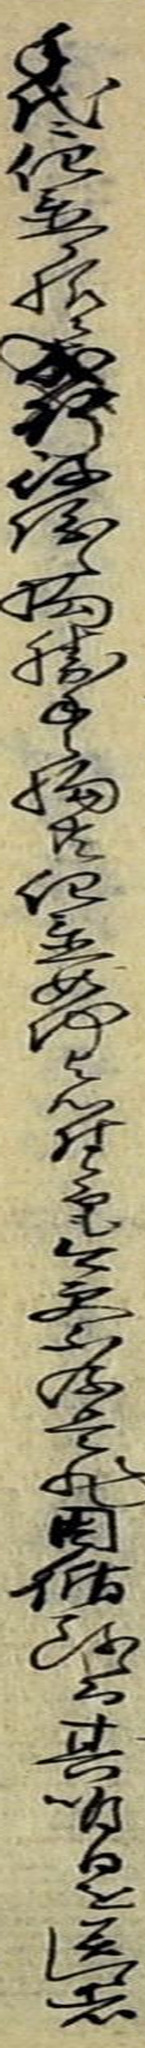手代ニ任置候様ニ成行役儀之拘勝手之拘共任置如何与心付候而も今更不及是非因循致候而其明日を送候者
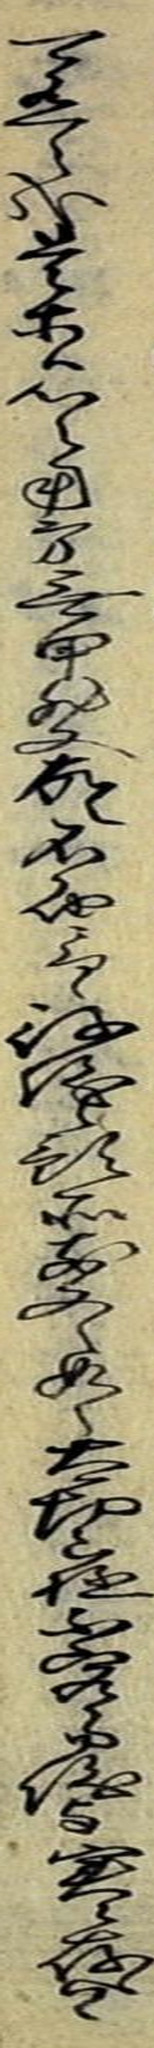可有之哉是等ハ心之用方無甲斐故之不届ニ而候役儀之預所前文之如く太切至極不容易儀与実々存候ハヽ
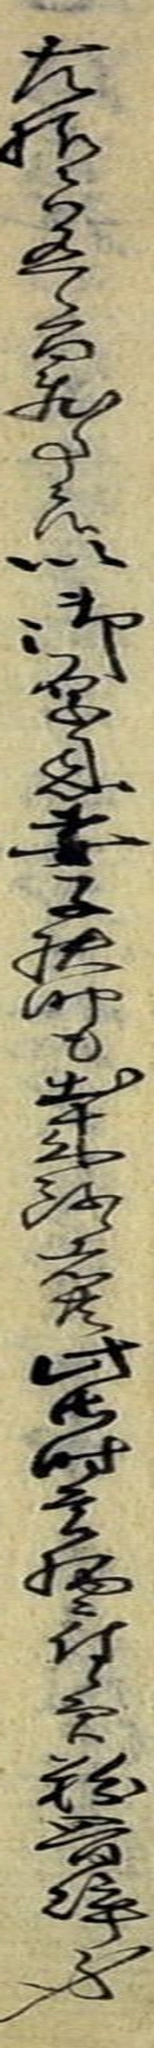左様ニハ有之間敷事ニ候以御厚恩妻子扶助も出来致候者共此御時節柄ニ付候而ハ粉骨砕身
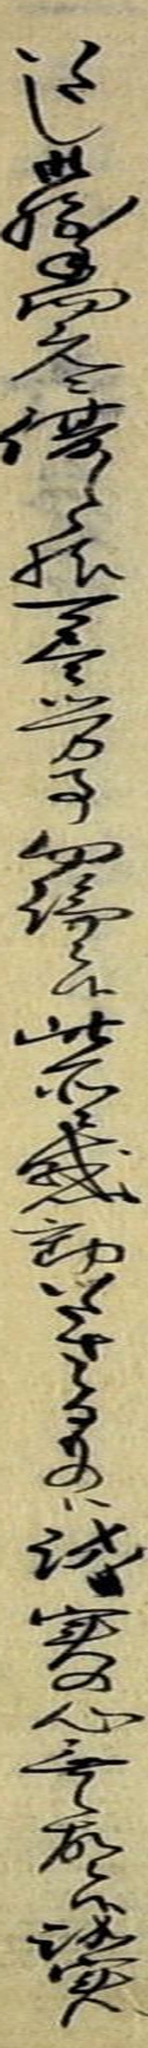いたし御勝手向元ニ復し候様可尽労事勿論ニ候此所ニ感動いたさゝるものハ誠実の心無之故ニ候誠実
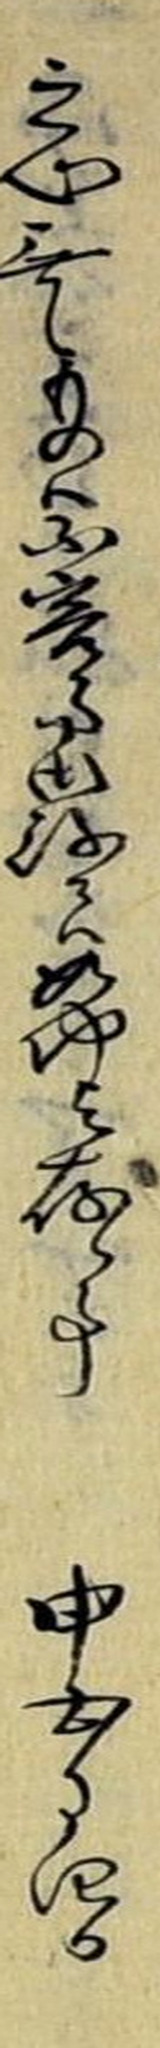之心無之ものハ不容易御役ニハ如何与存候事申五月四日
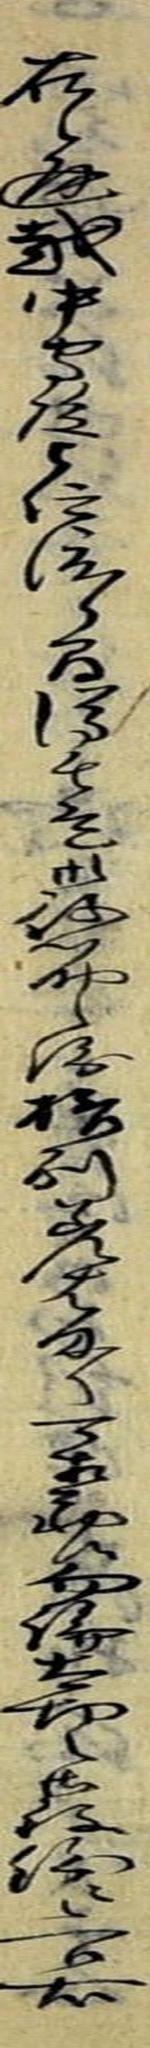右之通越中守殿被仰渡候間得其意御役筋之儀格別差はまり可相勤候勿論太切之御役儀ニ候ヘハ右
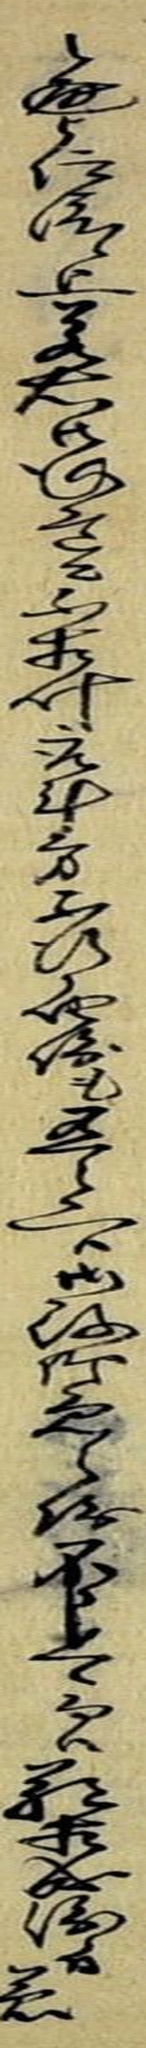之通被仰渡候上若右御趣意ニ不相叶ハ取計方不行届儀も有之候ヘハ御役御免之儀不申上候而ハ難相成儀ニ付兼
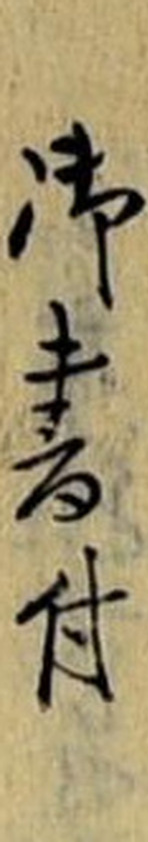御書付
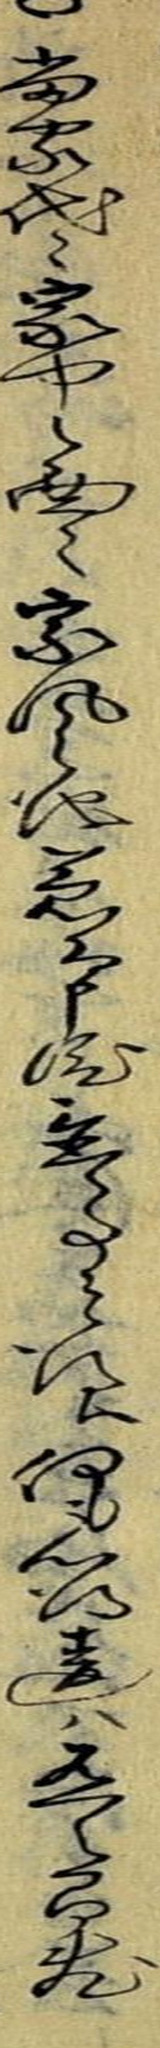〇当家代々家中之面々家風之儀兼而申渡置候事ニ候得ハ何も心得違ハ有之間敷
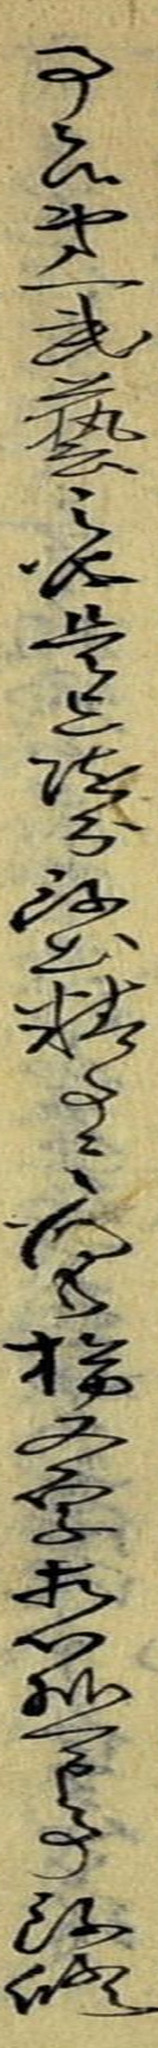事ニ候第一武芸之儀是迄随分致出精事ニ候得共猶又厚相心掛可申事致修
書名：命令之部 三
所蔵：福井県文書館 Fukui Prefectural Archives
